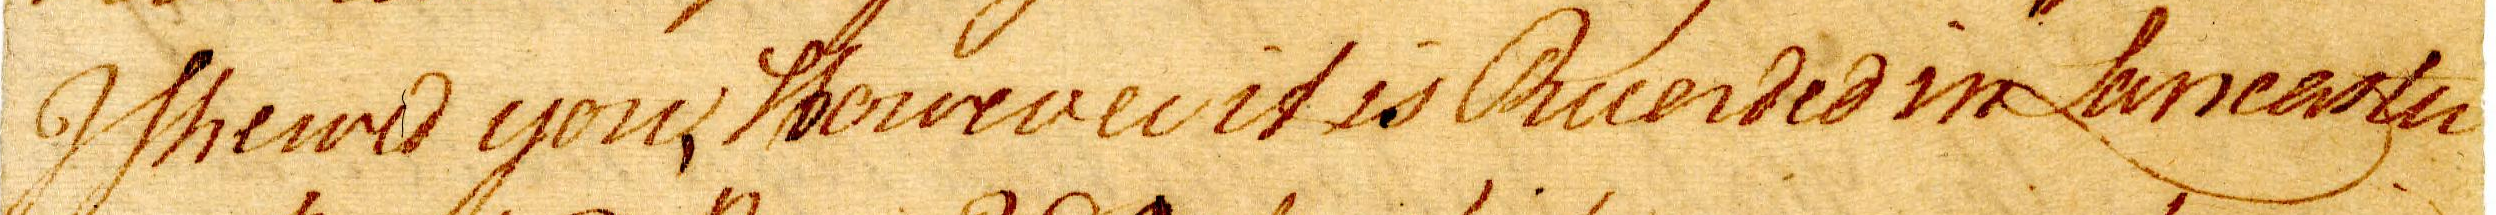I shewed you, However it is Recorded in Lancaster
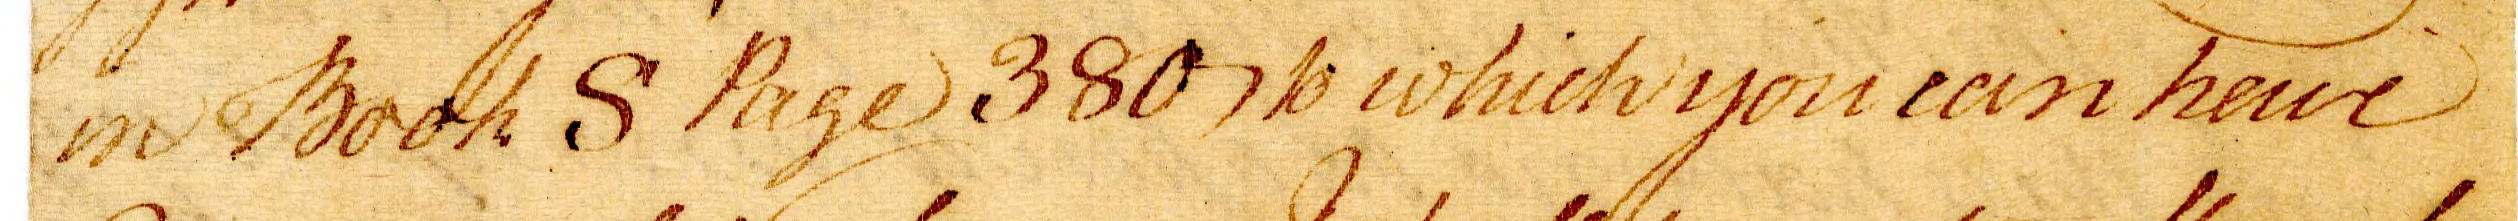in Book 8 Page 380 to which you can have
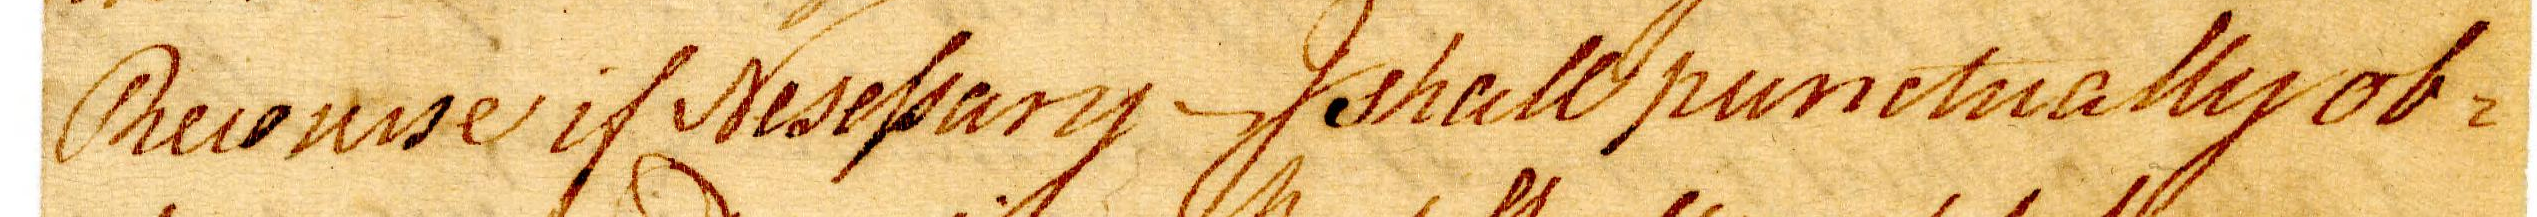Recourse if Necessary. I shall punctually ob-
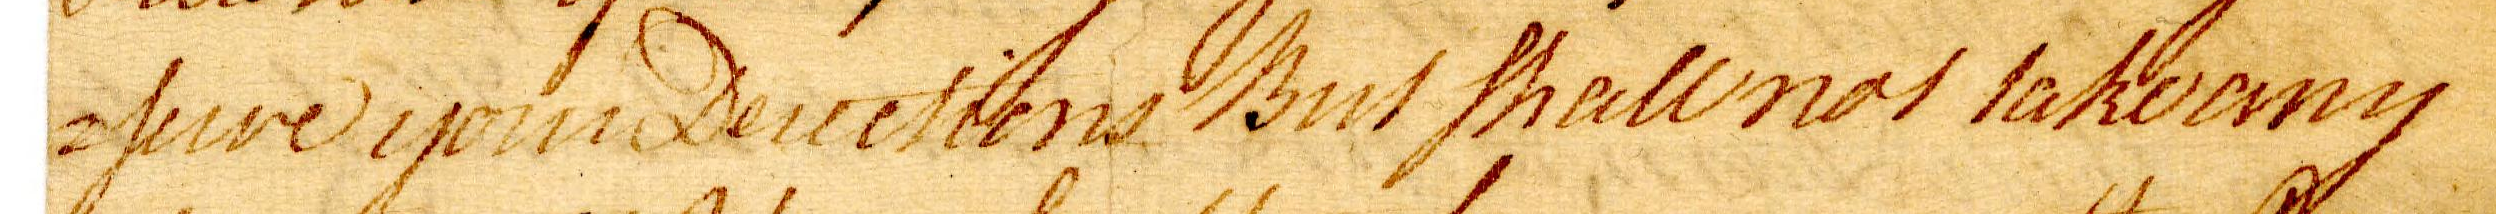-serve your Derections But shall not take any
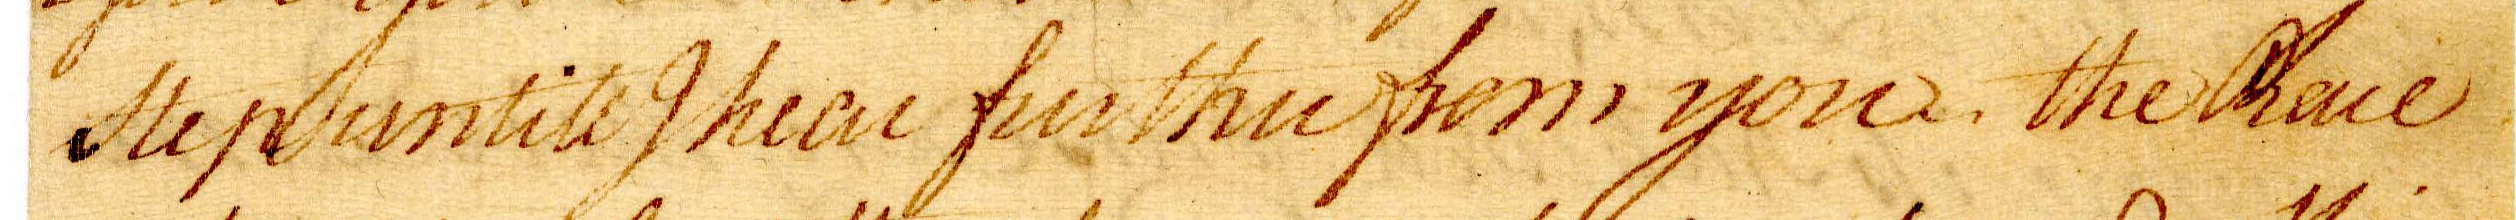Step until I hear further from you. the Race
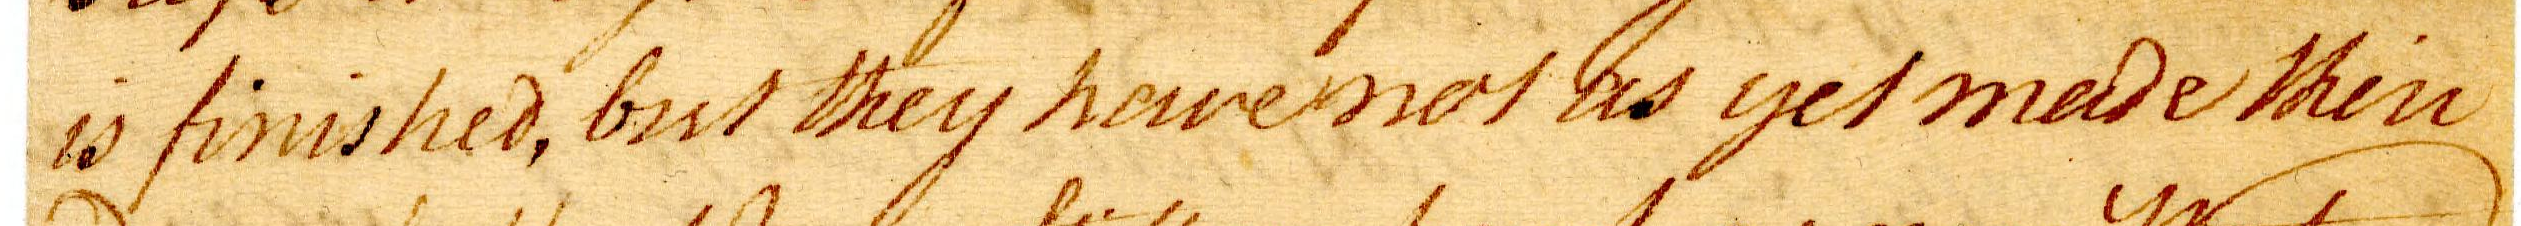is finished, but they have not as yet made their
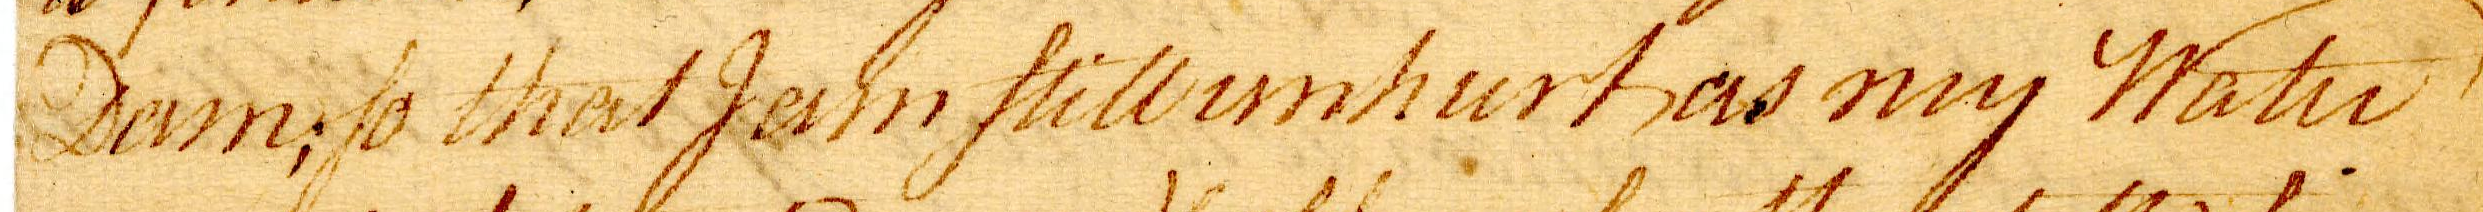Dam, so that I am Still unhurt as my Water
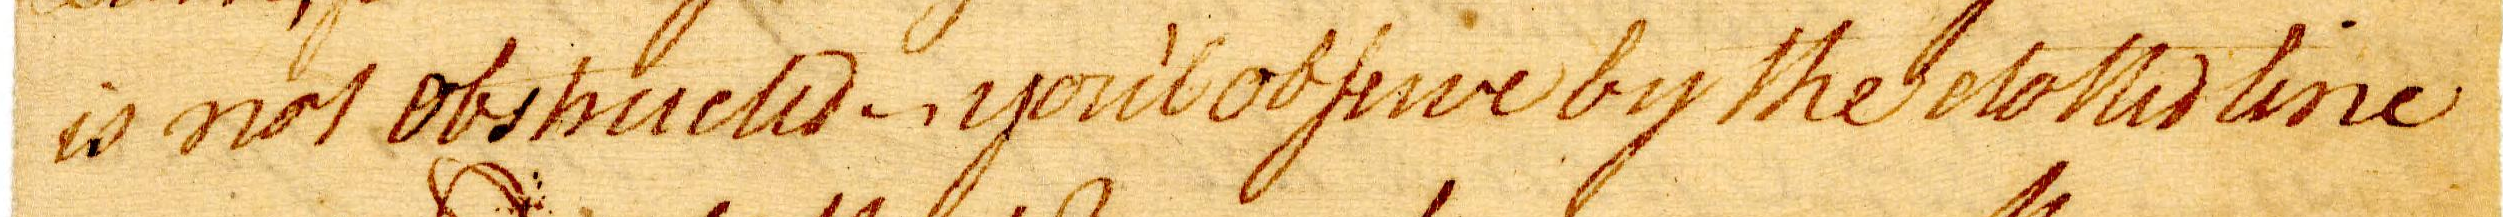is not obstructed. you'l observe by the dotted line
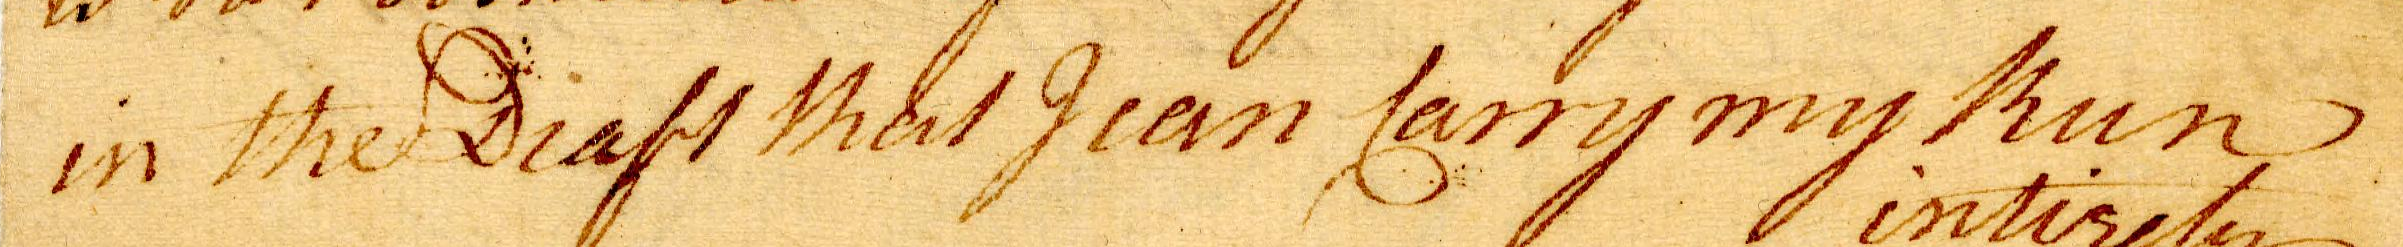in the Draft that I can Carry my Run
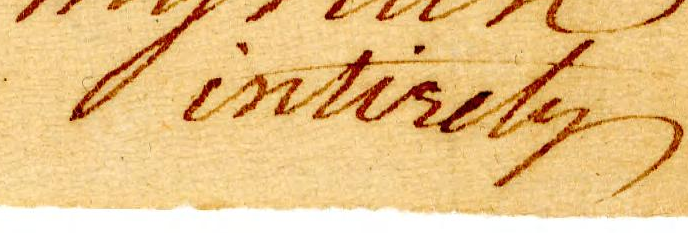intirely
